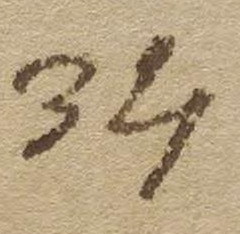34
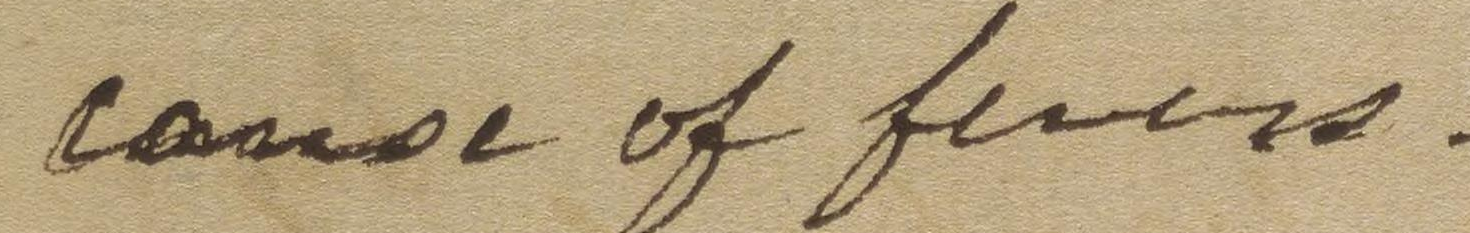cause of fevers.
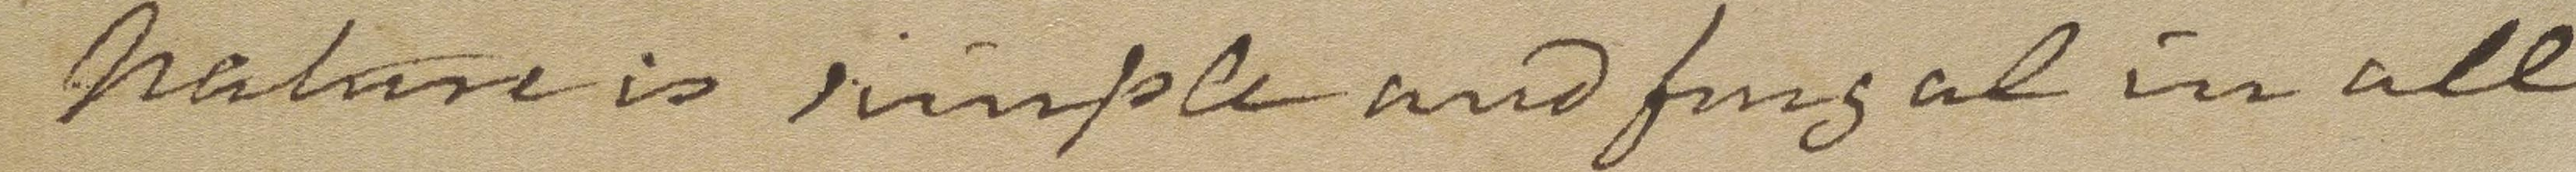Nature is simple and frugal in all
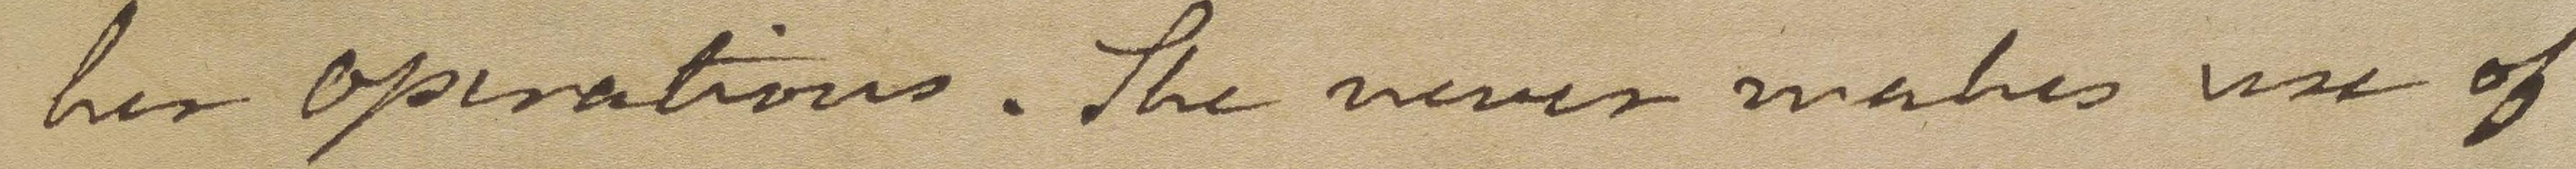her operations. She never makes use of
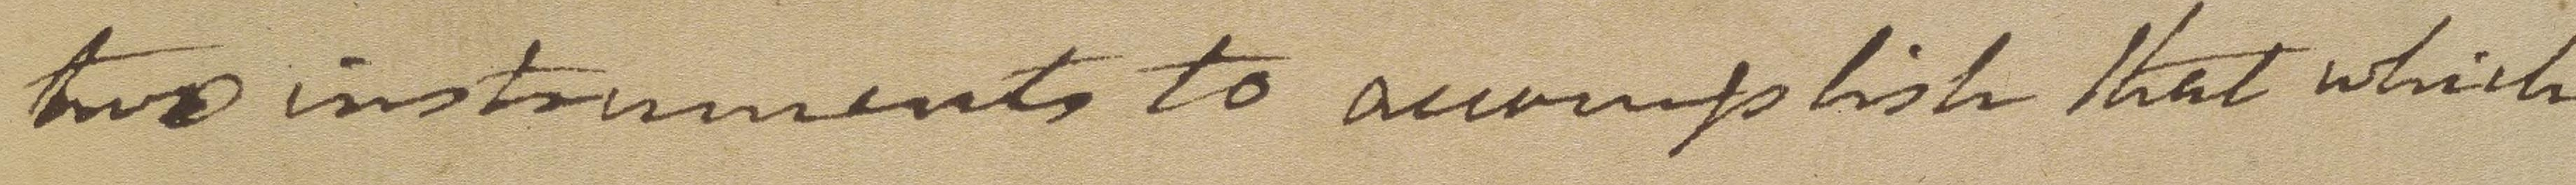two instruments to accomplish that which
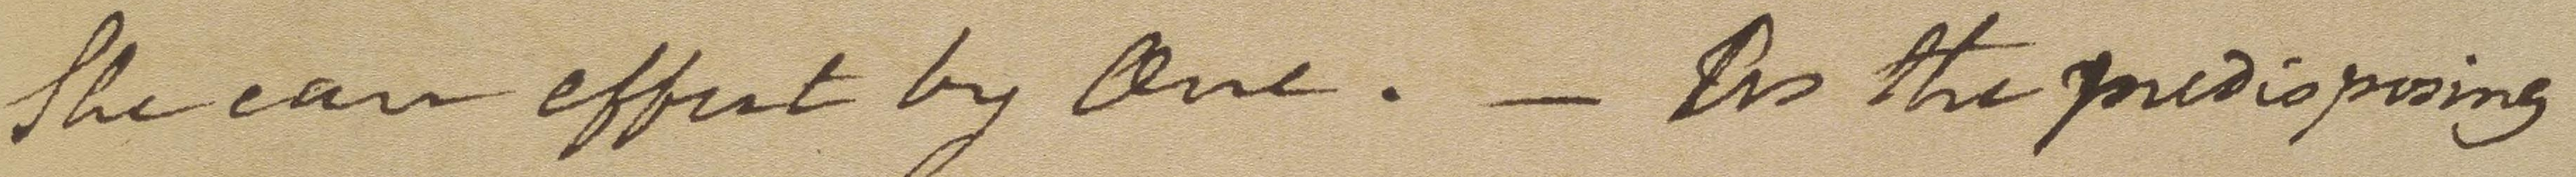she can effect by one.- On the predisposing
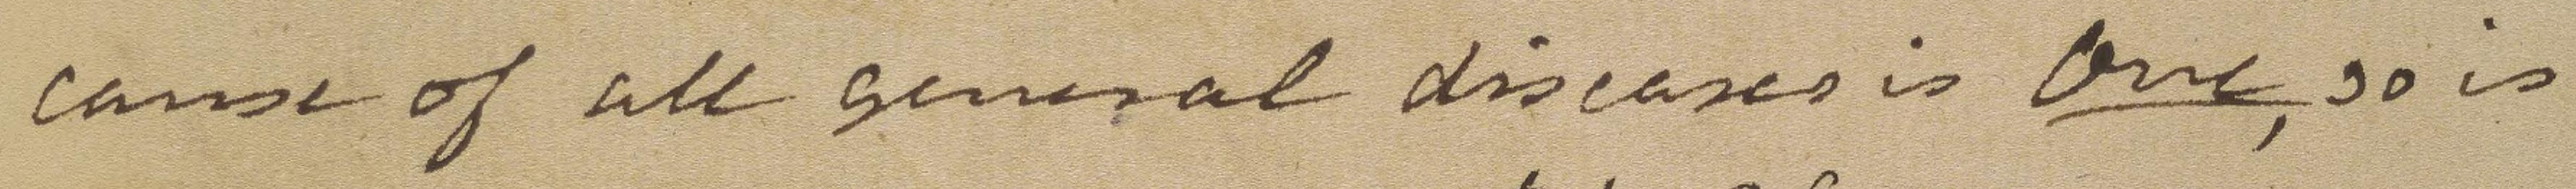cause of all general diseases is One, so is
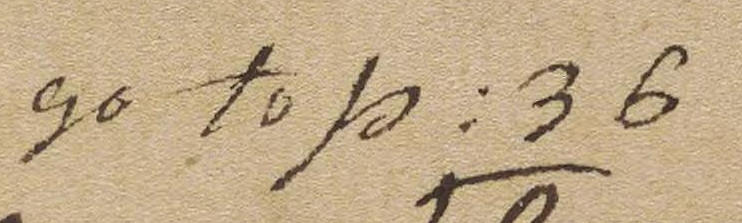go to p. 36-
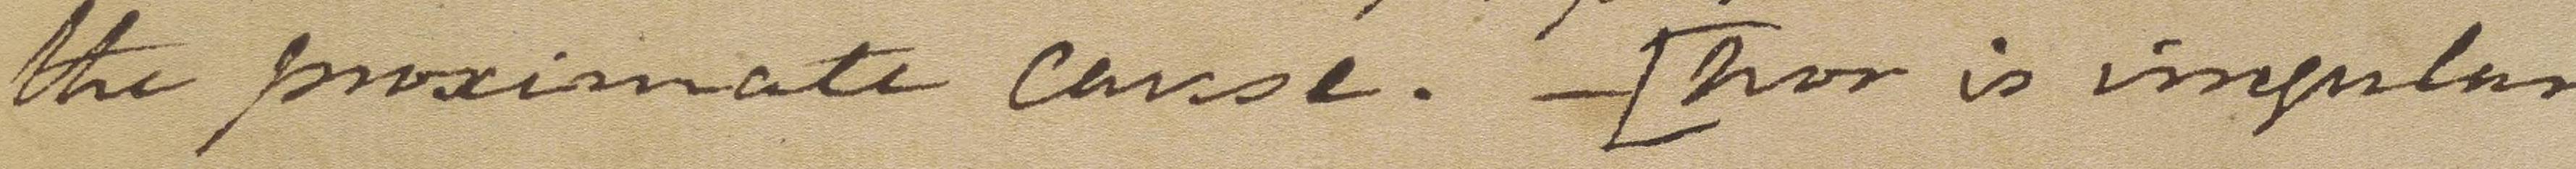the proximate cause.- (Nor is irregular
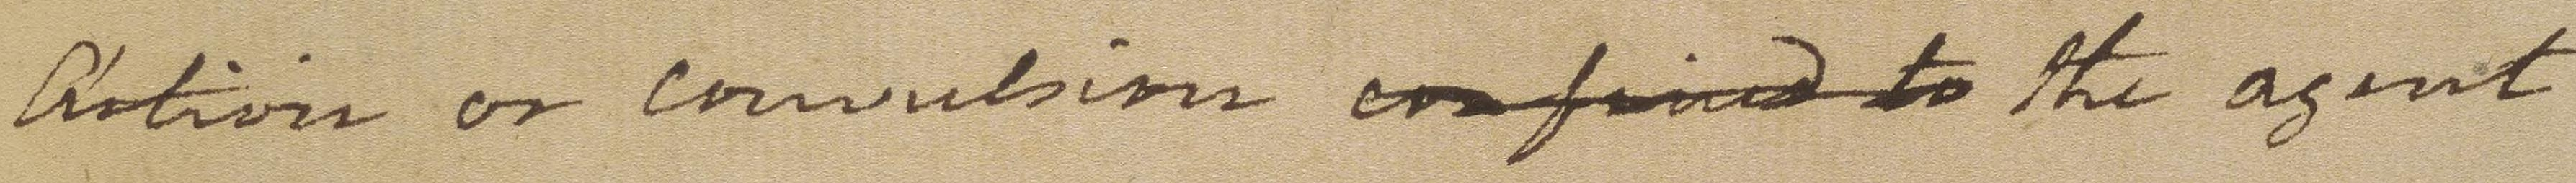Actions or Convulsion [confined to] the agent
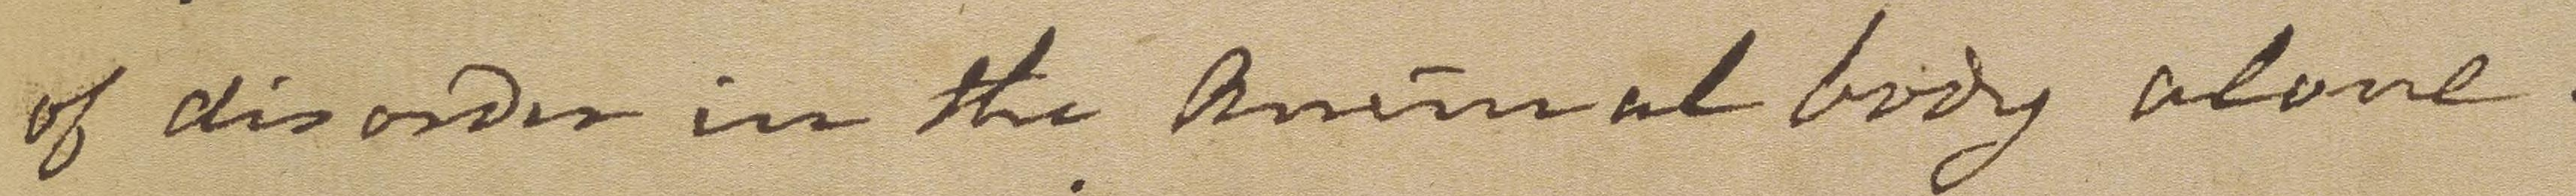of disorder in the animal body alone.
